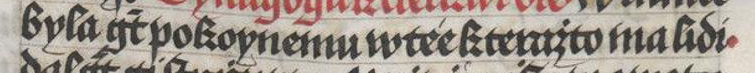byla ḡt pokoynemu w tee kterażto ma lidi.
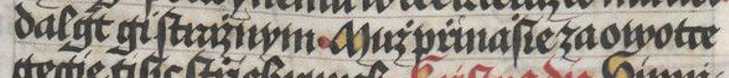dal ḡt gí ſtrażnym.Muż pṙinaẛie za owotce
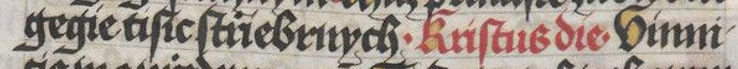gegíe tiſíc ſtṙíebrnych.Kriſtus díe. Vinni¬
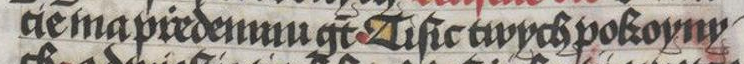cie ma pṙedemnu ḡt.Tiſic twych pokoyny¬
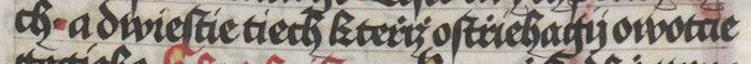ch.a dwieſtie tiech kteṙíż oſtṙiehagij owotcie
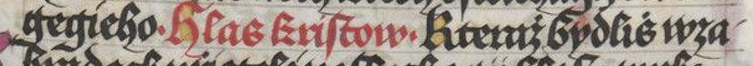gegíeho.Hlas kriſtow.Kteraż bydliṡ wza¬
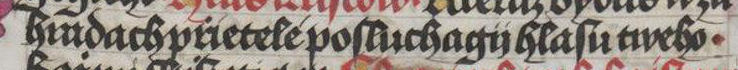hradach pṙíetelé poſluchagij hlaſu tweho.
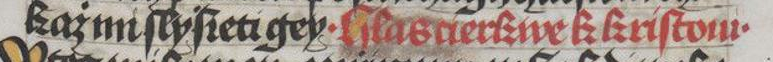każ mi ſlyẛieti gey.Hlas cíerkwe k kriſtoui.
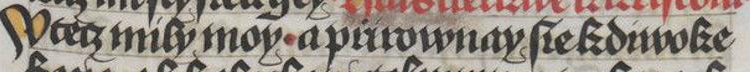Vtecz míly moy.a pṙirownay ſíe kdiwoke
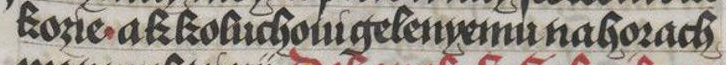kozie.akkoluchoui gelenyemu na horach
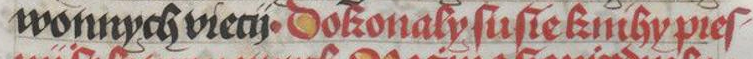wonnych viecij.Dokonaly ſu ſíe kníhy pieſ¬
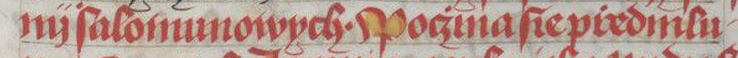níj ẛalomunowych.Pocżina ſie pṙedmlu¬
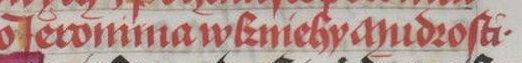Ieronima w kniehy.Mudroſti.
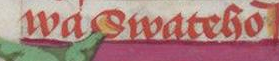wa Swateho
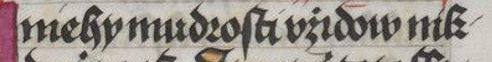níehy mudroſti vżidow nik¬
